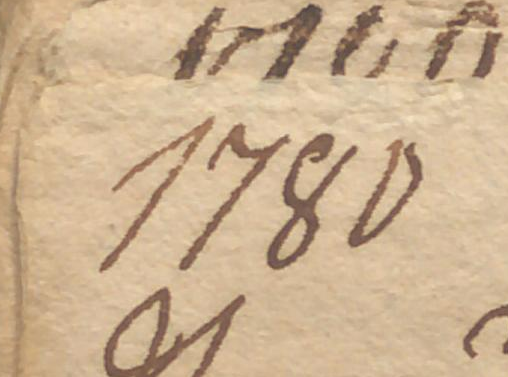1780
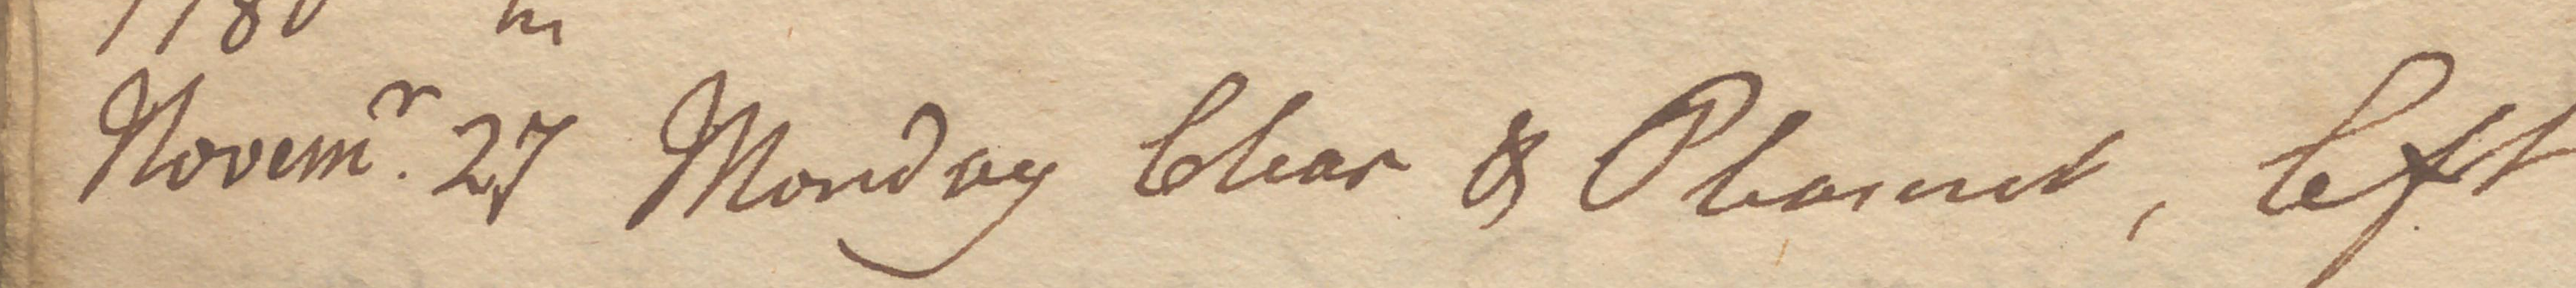Novem^r. 27 Monday Clear & Pleasent, left
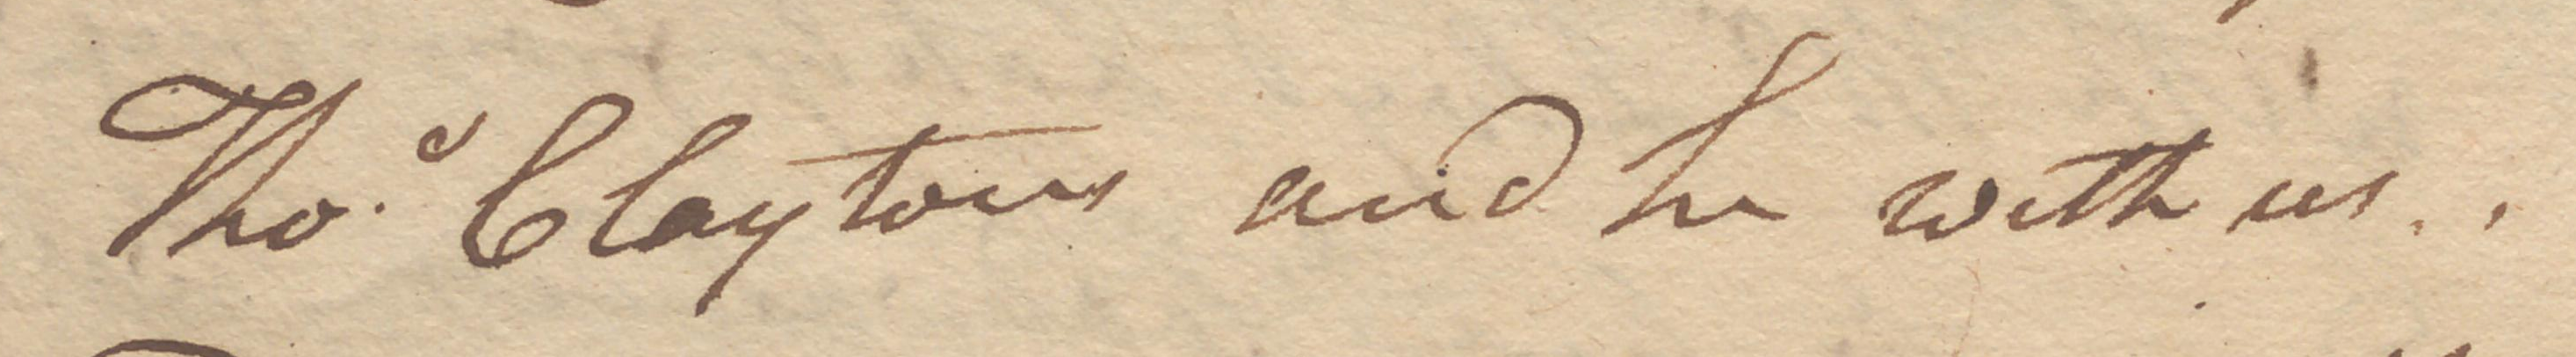Tho^s. Claytons and he with us
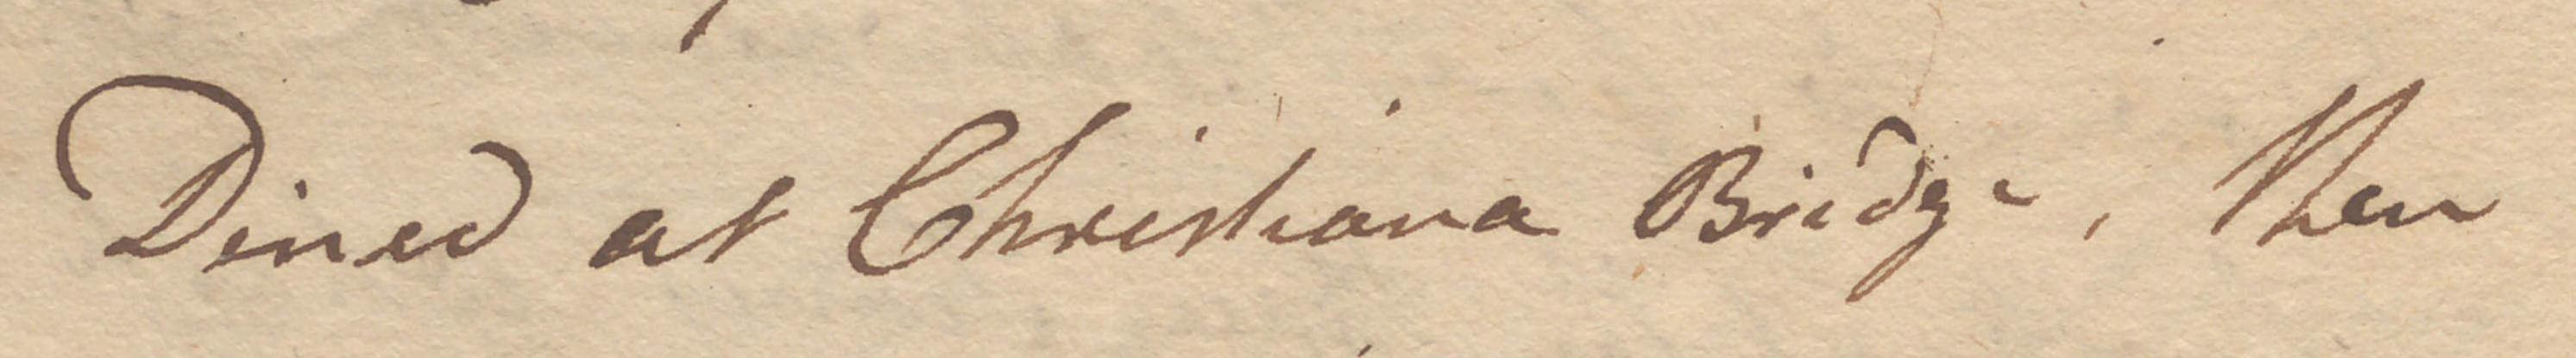Dined at Christiana Bridge, then
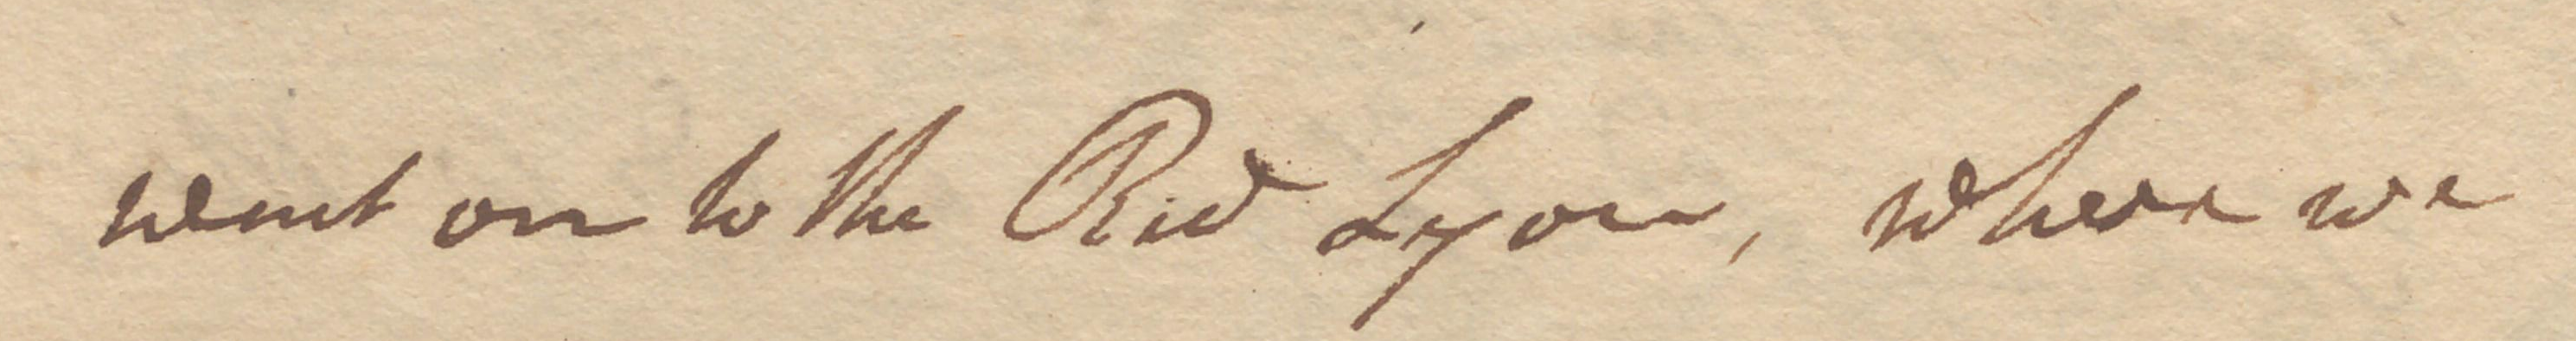went on to the Red Lyon, where we
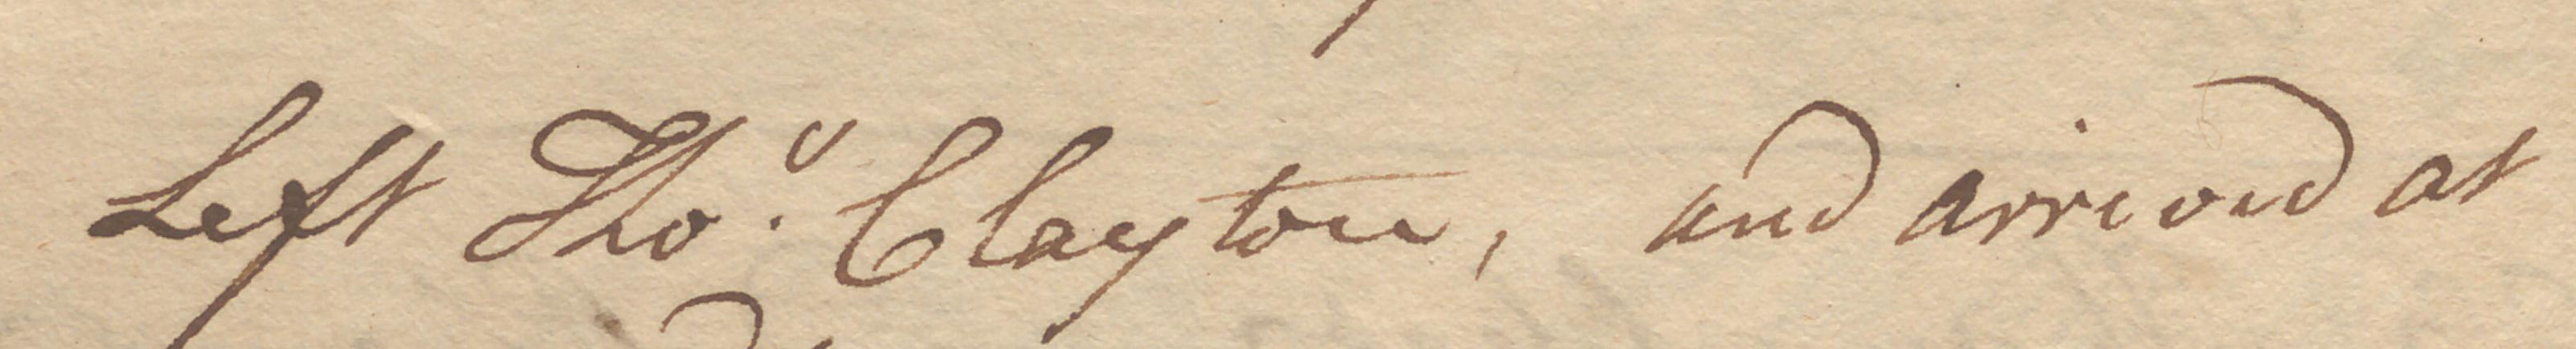Left Tho^s. Clayton, and arrived at
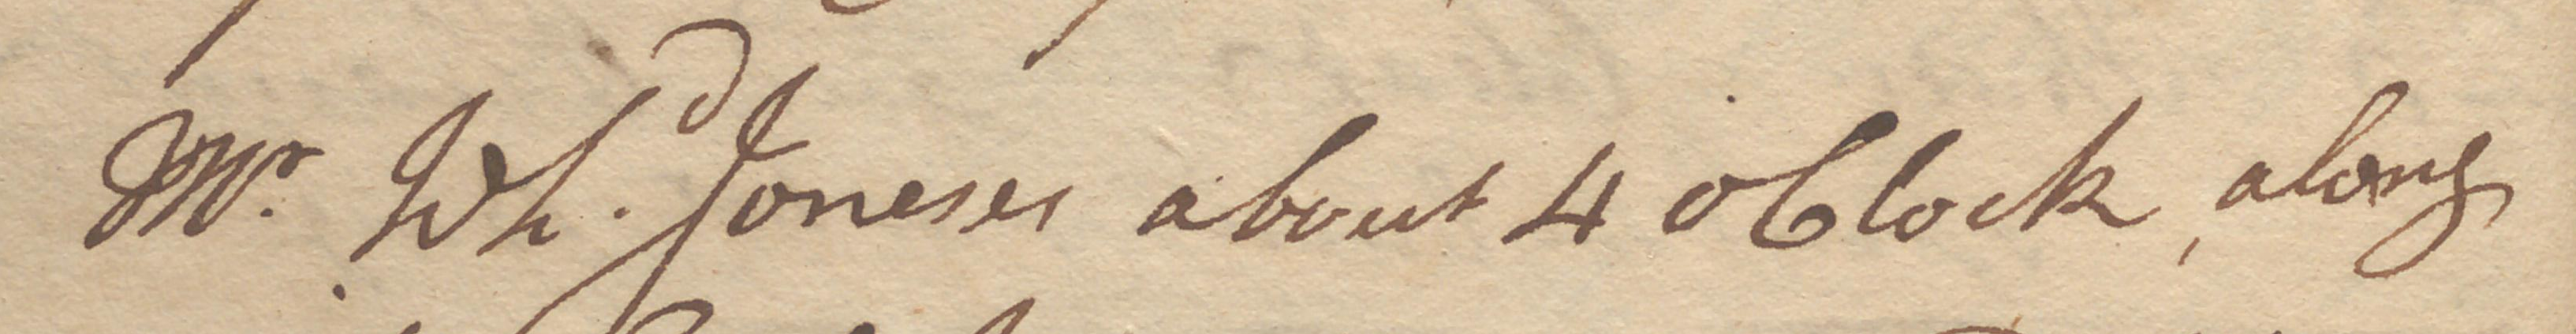M^r. Wh^d. Joneses about 4 oClock along
